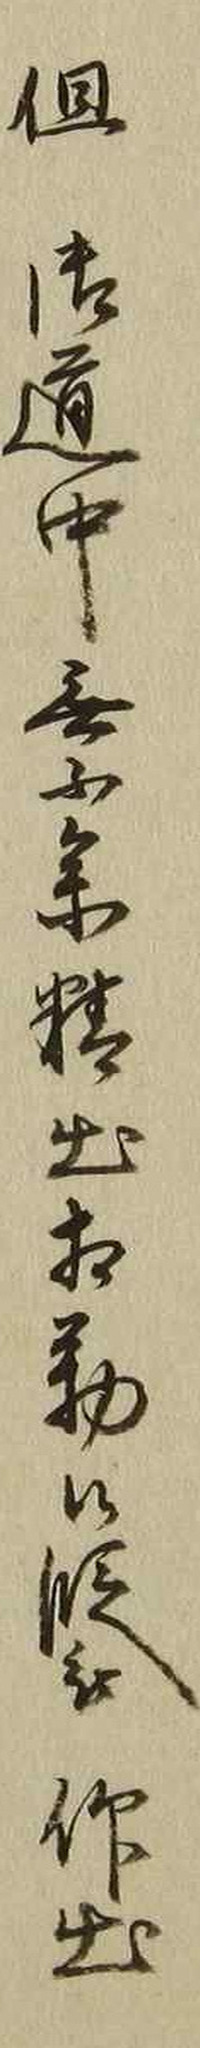但御道中無不参精出相勤候段被仰出
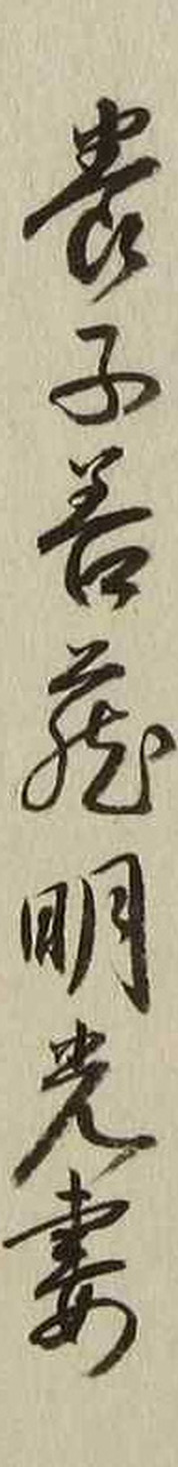女養子善蔵明光妻
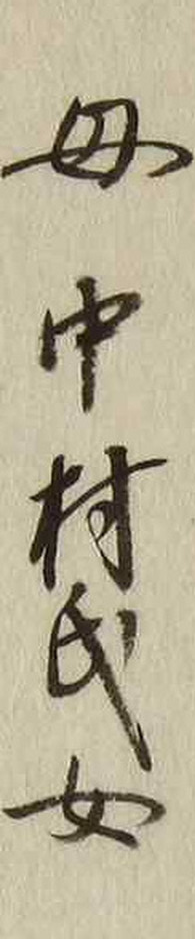母中村氏女
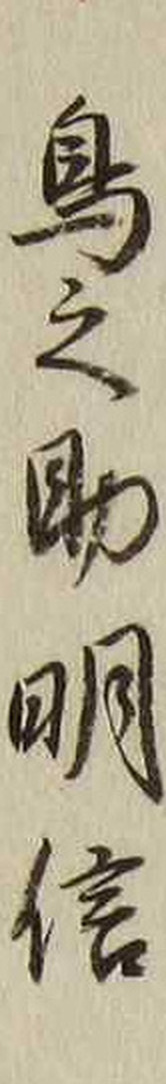鳥之助明信
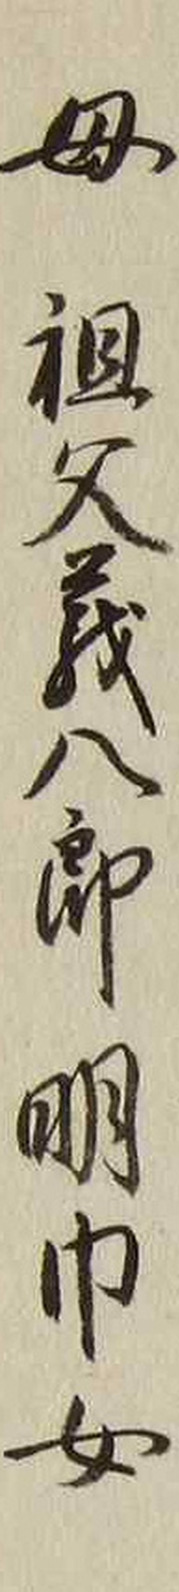母祖父義八郎明巾女
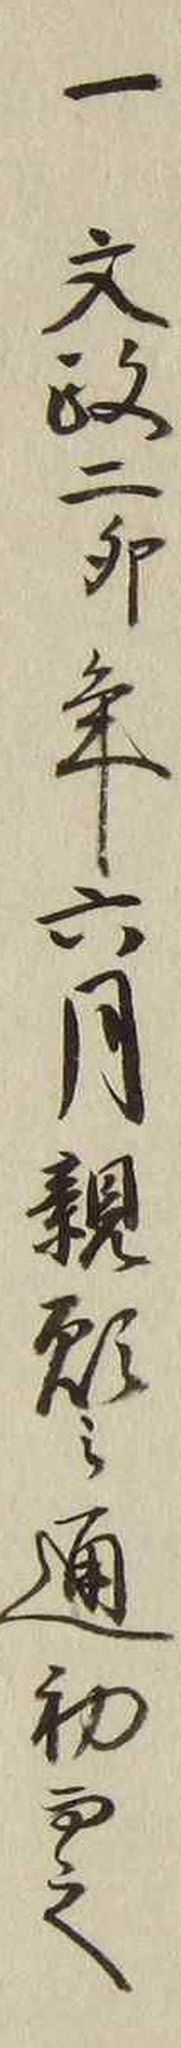一文政二卯年六月親願之通初而之
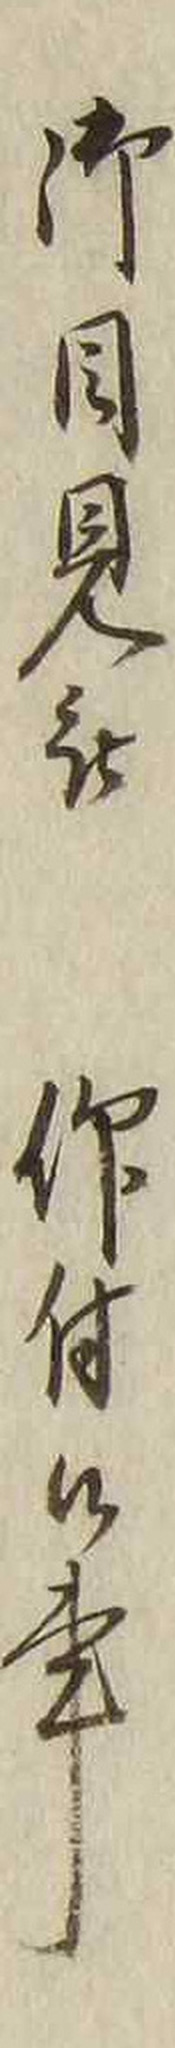御目見被仰付候事

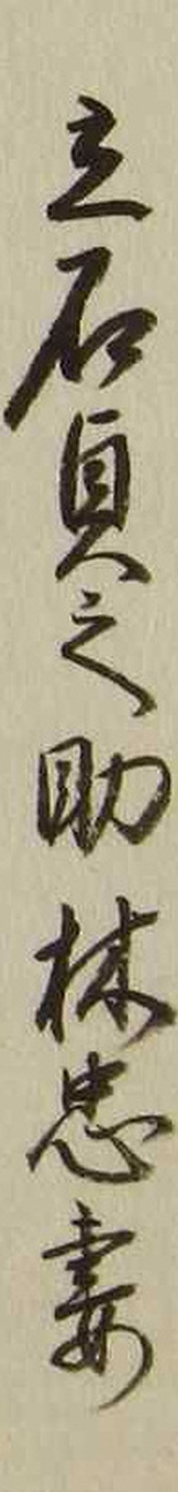女立石貞之助林忠妻
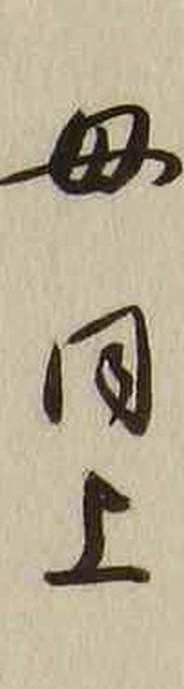母同上
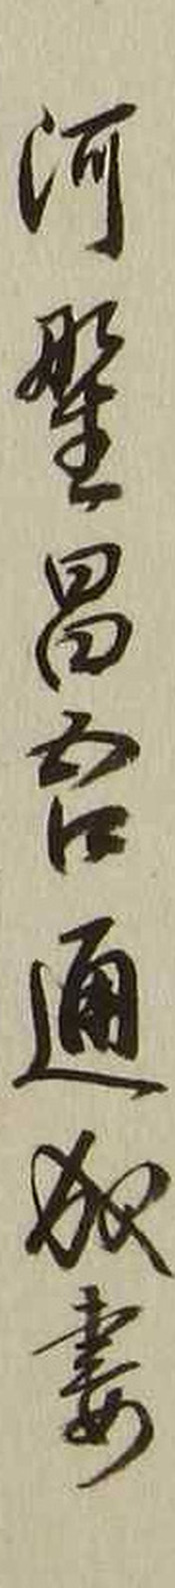女河野昌吾道成妻
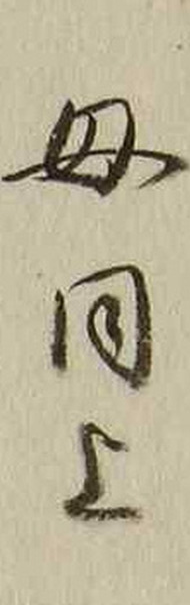母同上
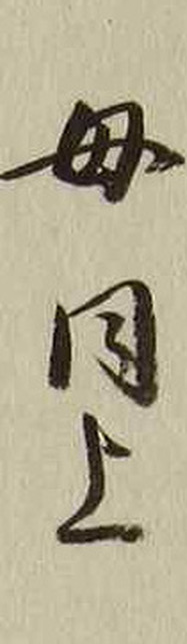母同上
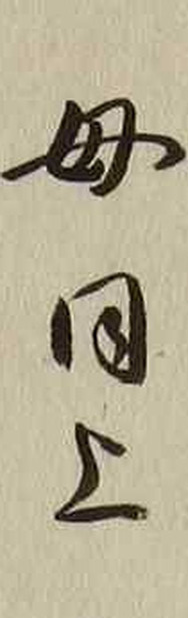母同上
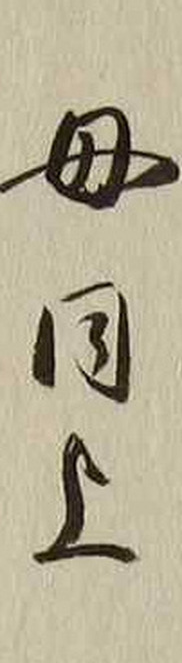母同上
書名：諸士系譜　巻之128　た之部4
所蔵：会津若松市立会津図書館
